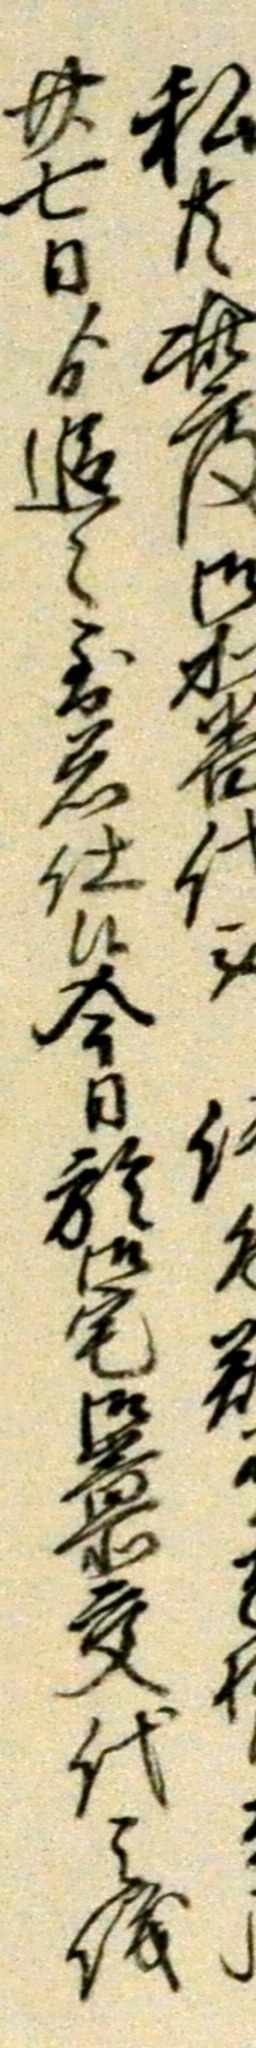廿七日ゟ追々到着仕候今日於御宅御番所交代之儀
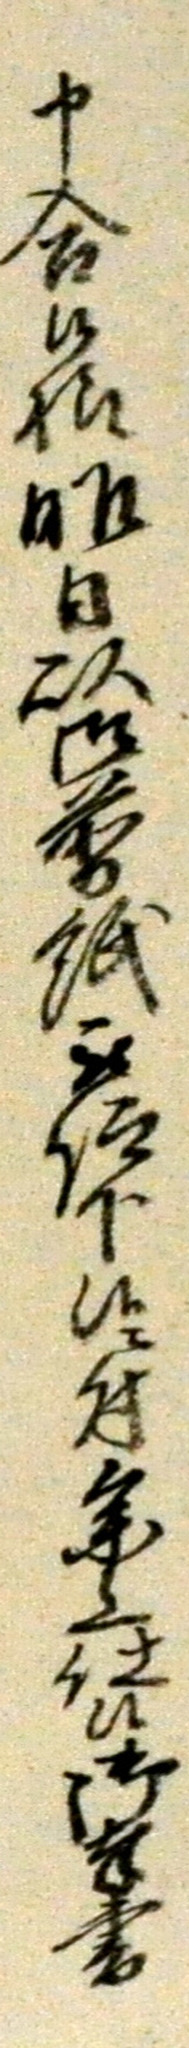申合候様昨日以剪紙被仰下候ニ付参上仕候御奉書
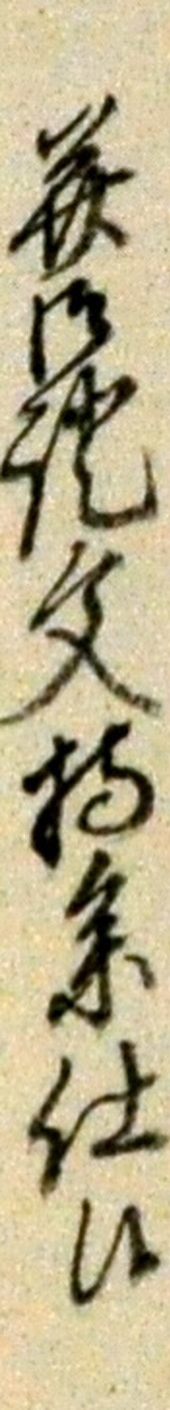并御證文持参仕候
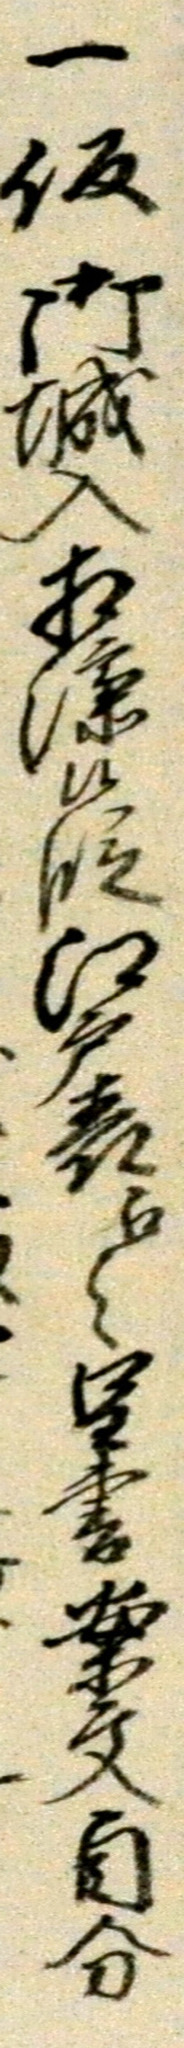一仮御城入相済候段江戸表え之口上書案文自分
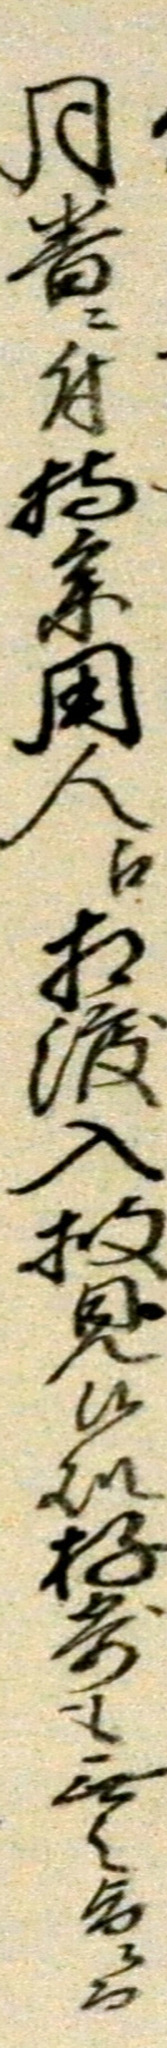月番ニ付持参用人え相渡入披見候処存寄も無之旨ニ而
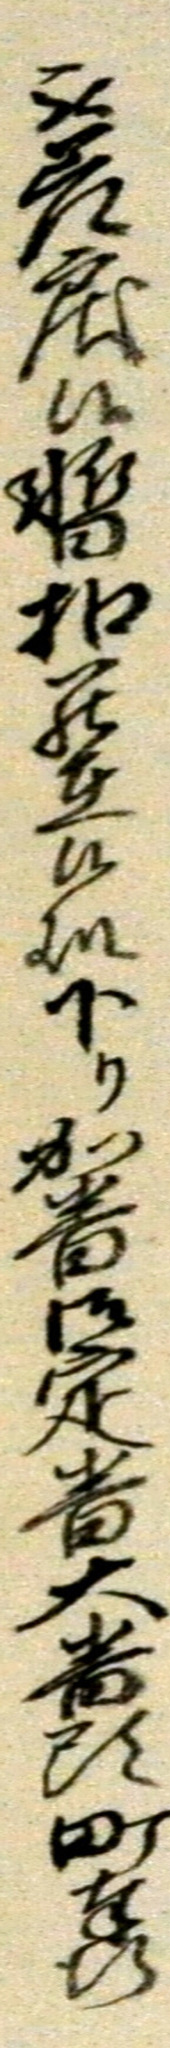被差戻候暫扣罷在候処下り加番御定番大番頭町奉行
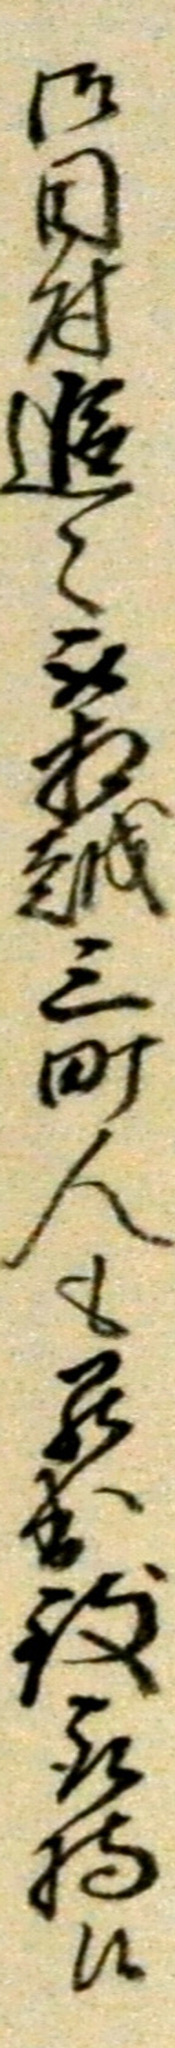御目付追々被相越三町人も罷出致取持候
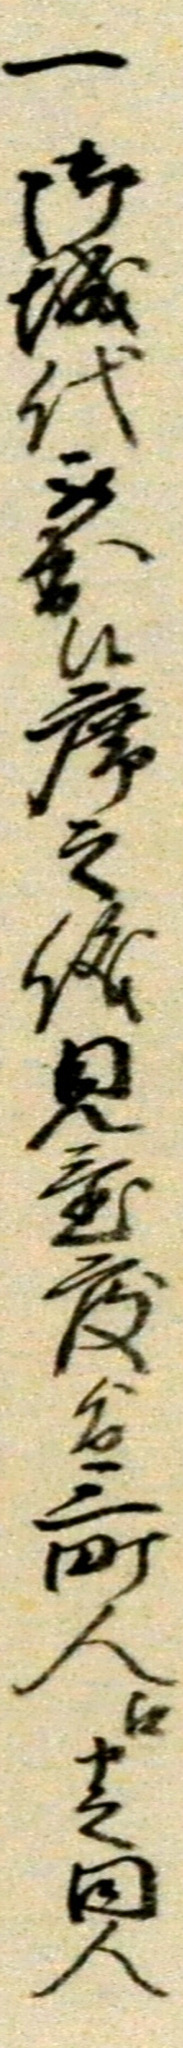一御城代被出候席之儀見置度旨三町人え申之同人
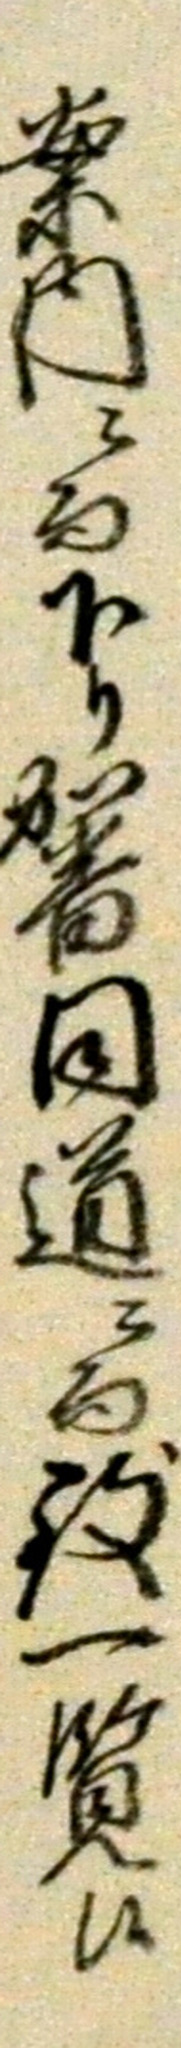案内ニ而下り加番同道ニ而致一覧候
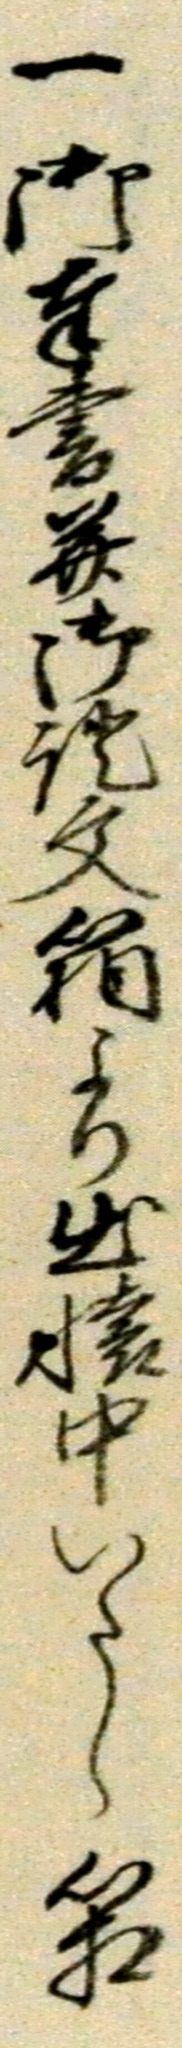一御奉書并御證文箱より出懐中いたし箱
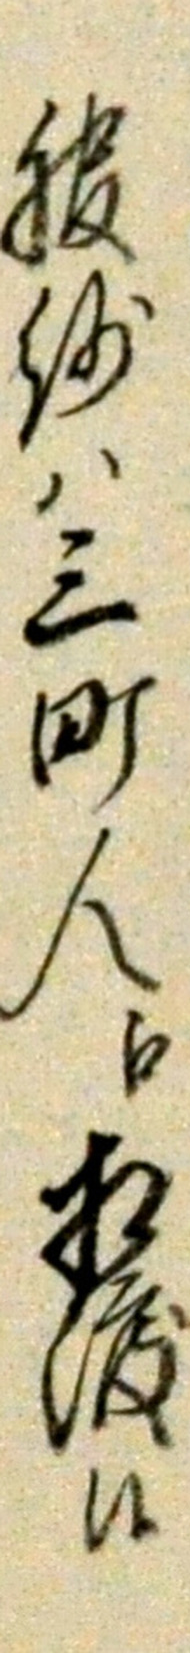服紗ハ三町人え相渡候

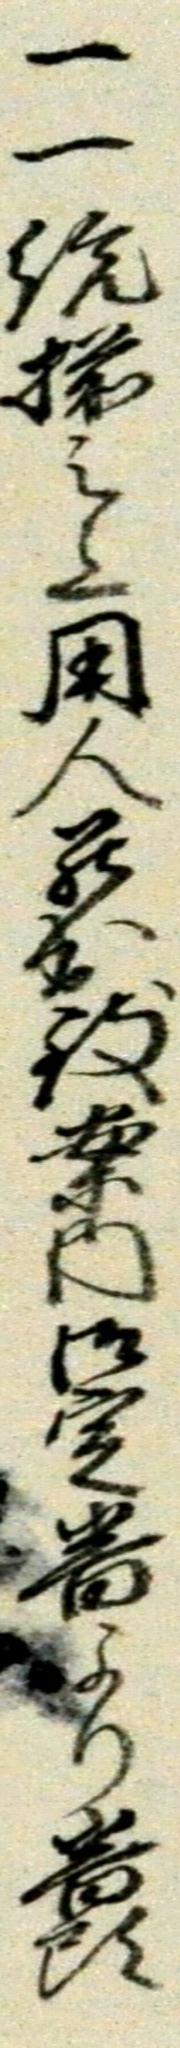一一統揃之上用人罷出致案内御定番より番頭
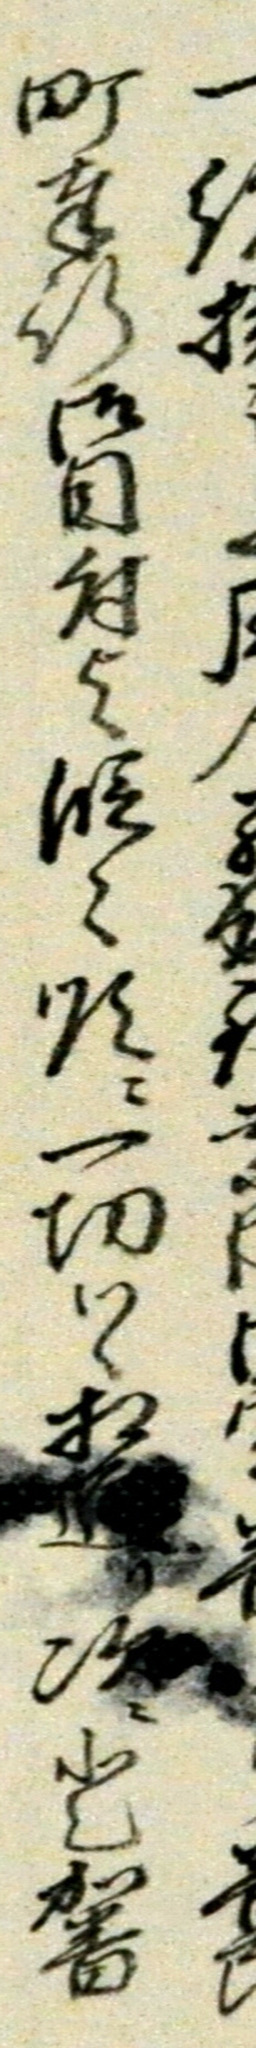町奉行人御目付と段々順ニ一切ツヽ相通り次ニ登加番
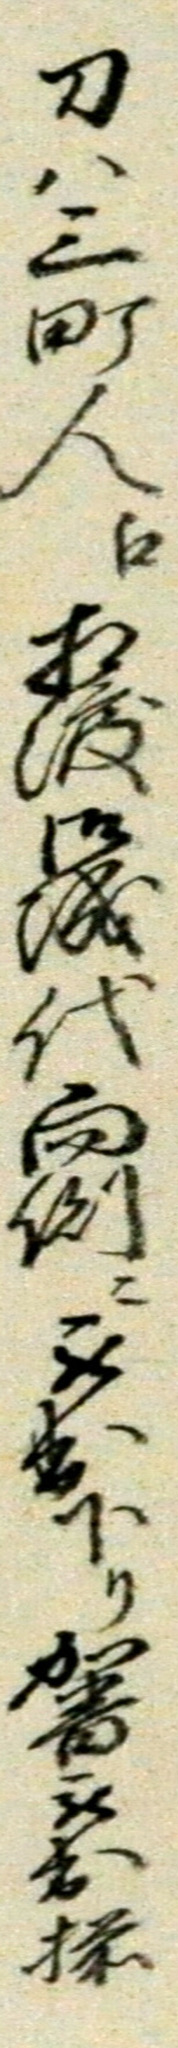刀ハ三町人え相渡御城代向側ニ罷出下り加番被出揃
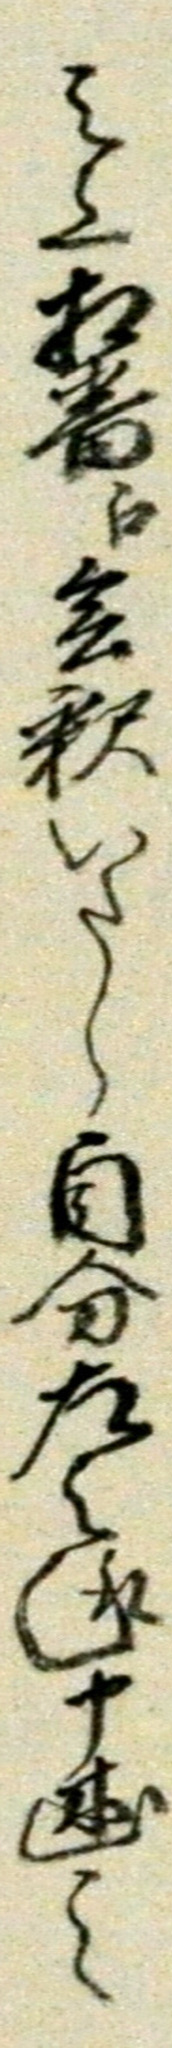之上相番え会釈いたし自分左之趣申述候
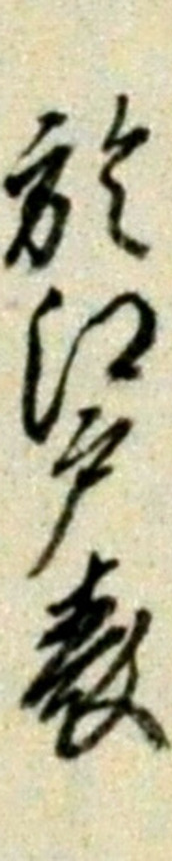於江戸表
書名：大阪加番関係諸書留〔一括〕
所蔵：伊那市立高遠町図書館・合同会社AMANE
